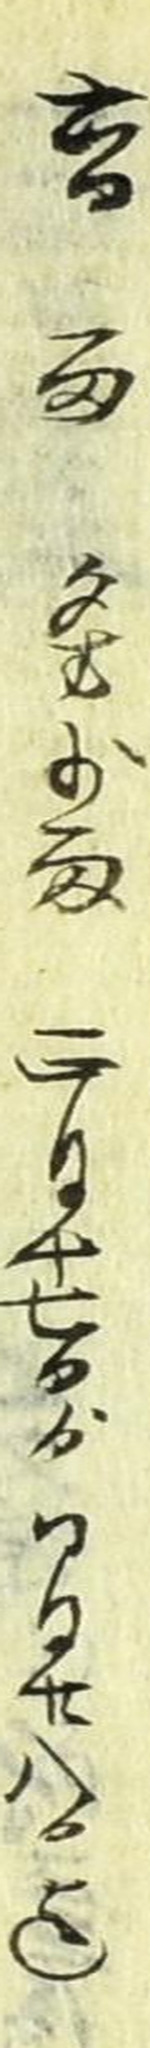六日雨夕方少雨正月十七日ゟ同月廿八日迄
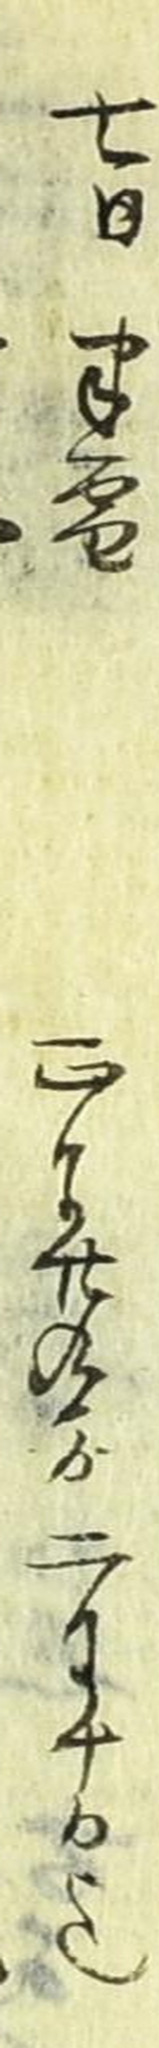七日半雪正月廿九日ゟ二月十日迄
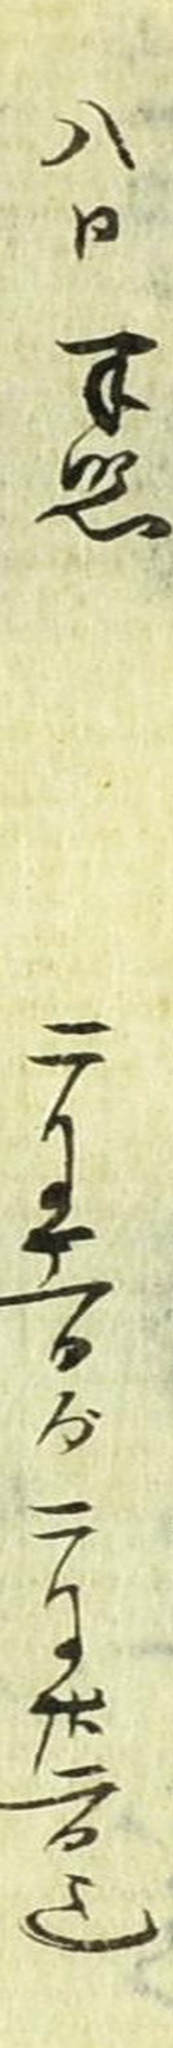八日半照二月十一日ゟ二月廿二日迄
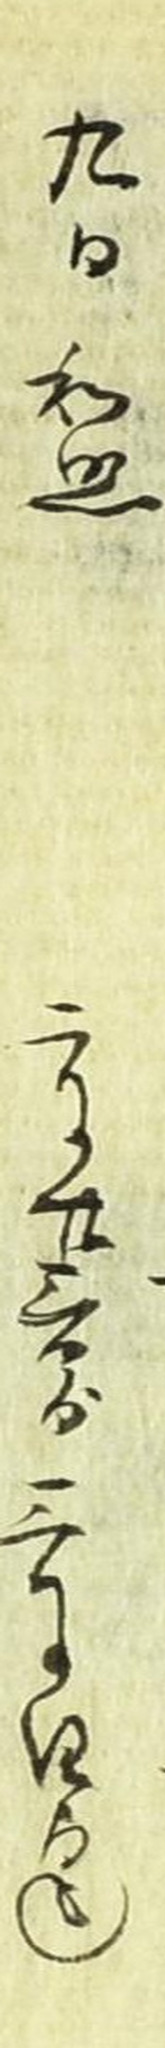九日和照二月廿三日ゟ三月四日迄
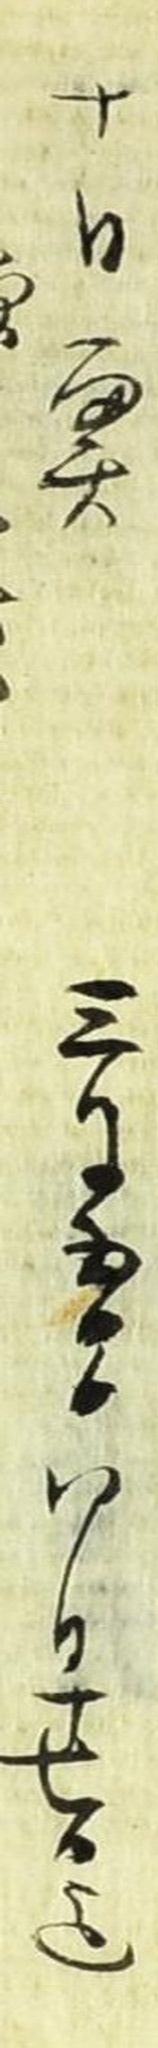十日雨天三月五日ゟ同月十七日迄
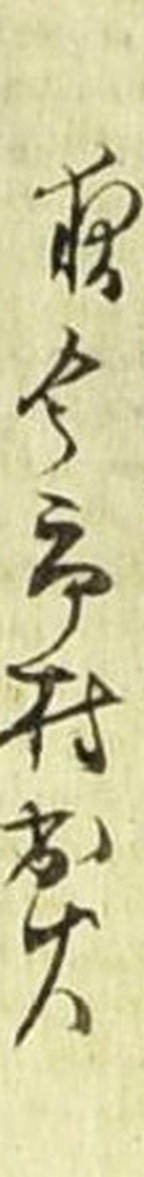夜今市村出火
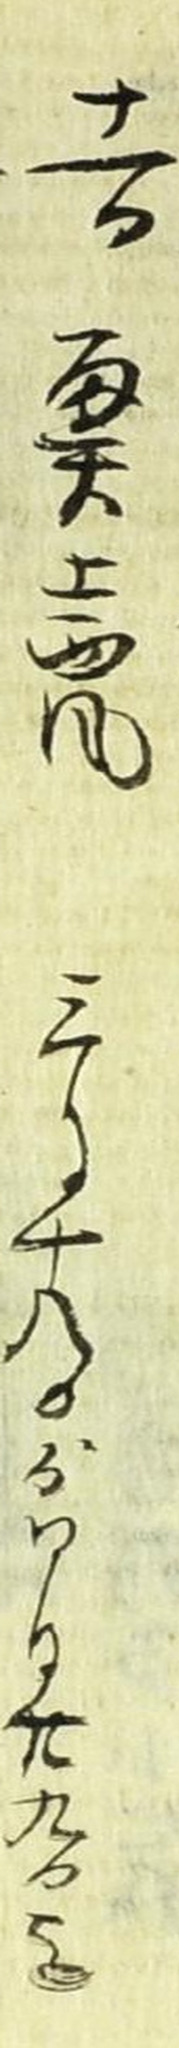十一日雨天上西風三月十八日ゟ同月廿九日迄
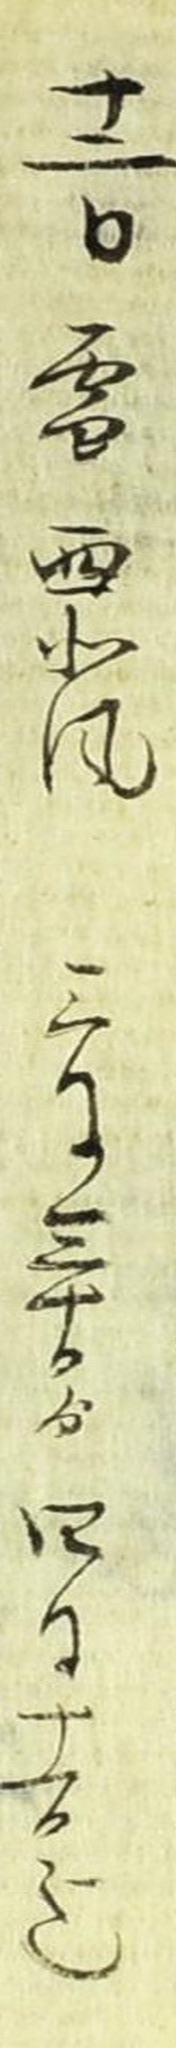十二日雪西北風三月三十日ゟ四月十一日迄
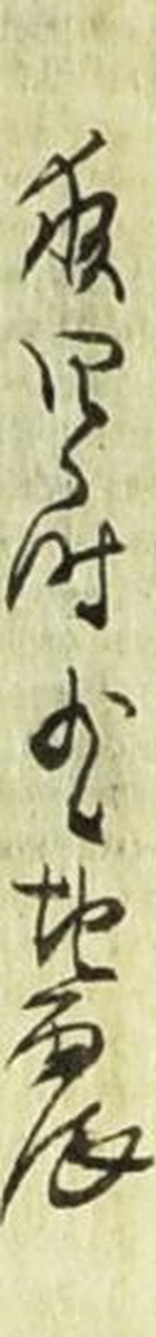夜四ツ時少々地震
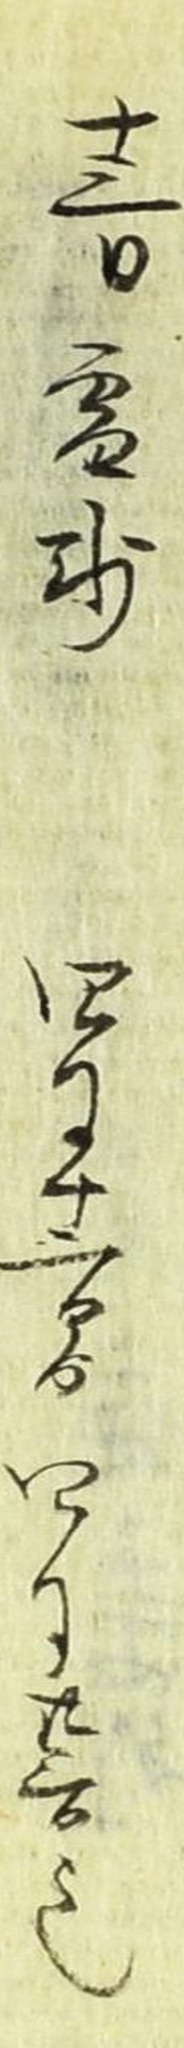十三日雪氷四月十二日ゟ四月廿三日迄
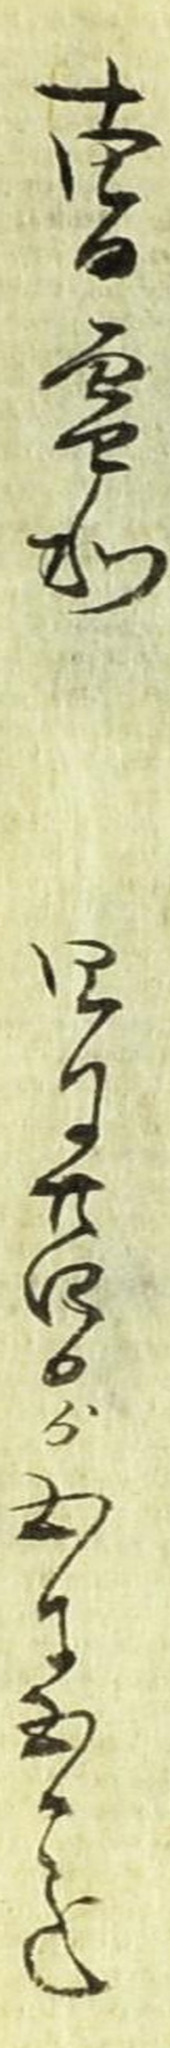十四日雪和四月廿四日ゟ五月五日迄
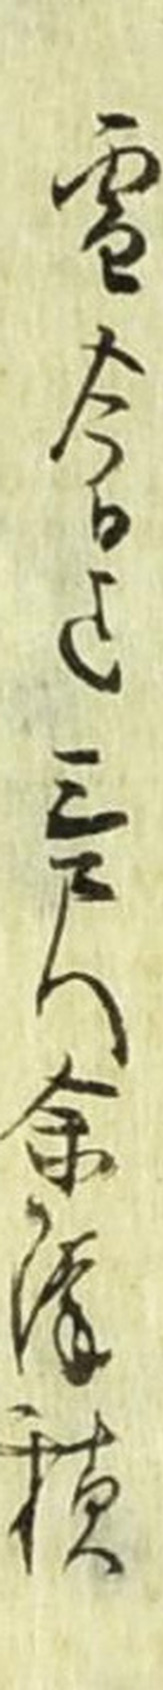雪今日迄三尺余降積
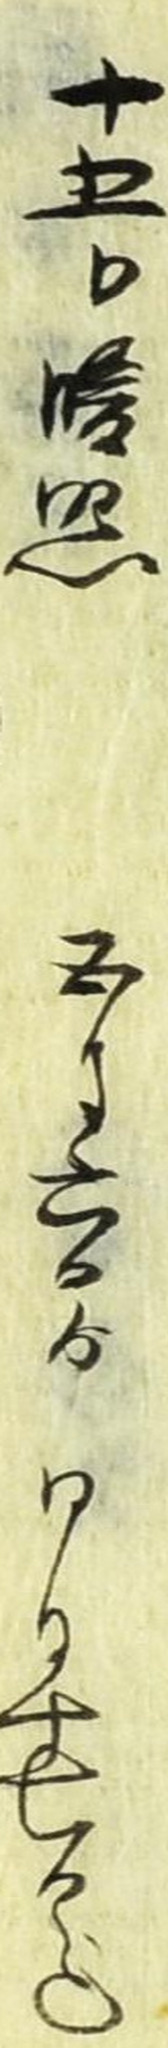十五日暖照五月十六日ゟ同月十七日迄
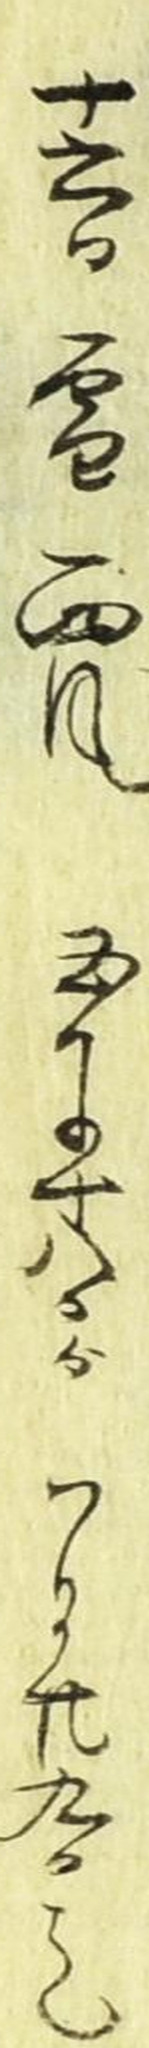十六日雪西風五月十八日ゟ同月廿九日迄
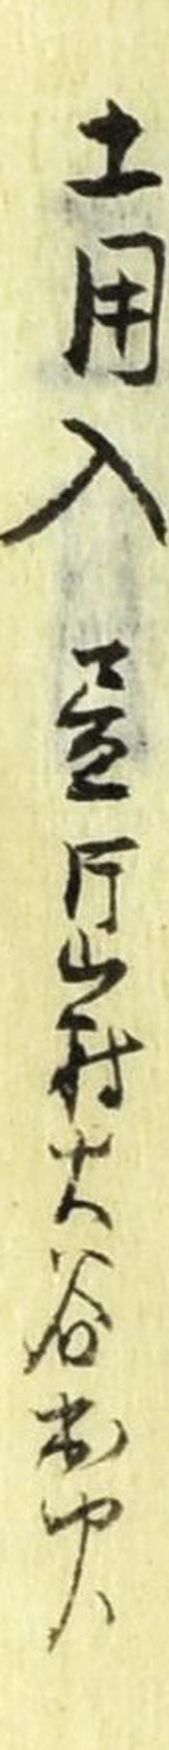土用入昼片山村大谷村出火
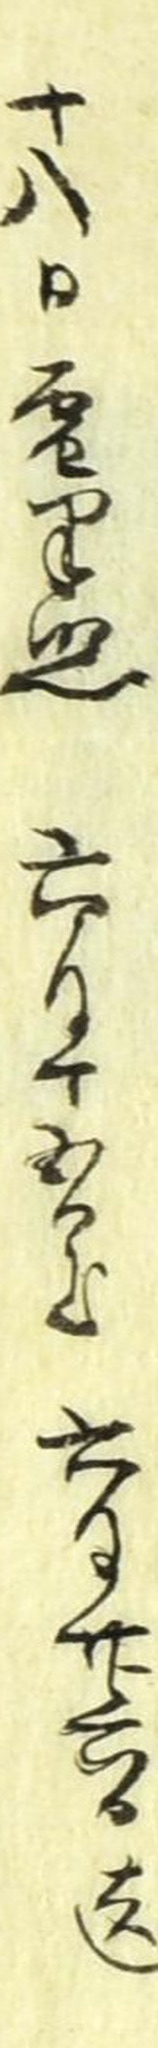八日半照二月十一日ゟ二月廿二日迄
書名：（日記）
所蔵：福井県文書館 Fukui Prefectural Archives
